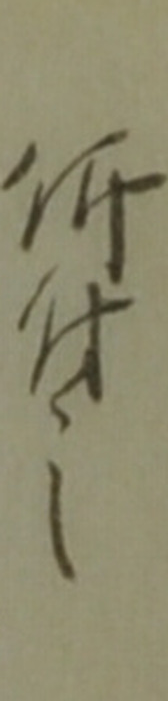仰付之
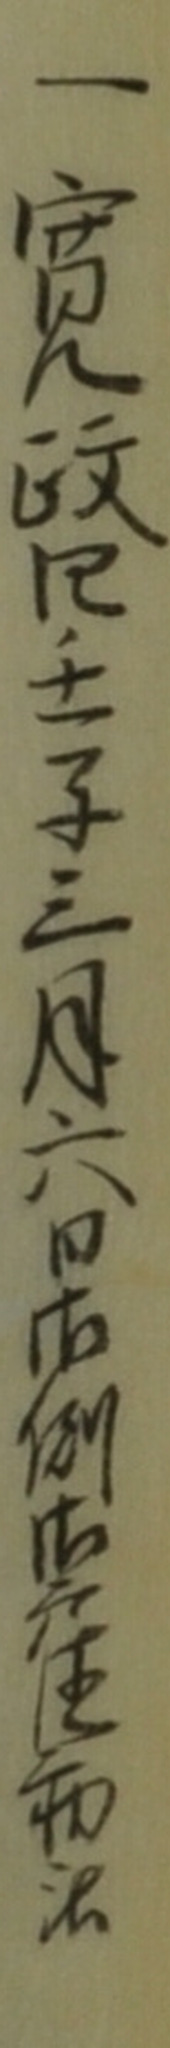一寛政四壬子三月六日御側御雇勤被
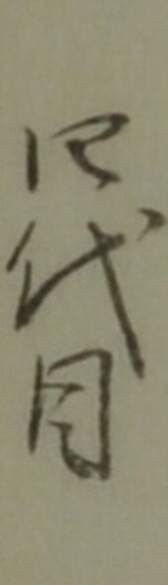四代目
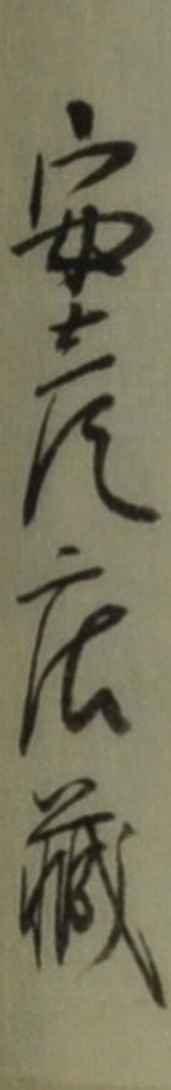安彦庄蔵
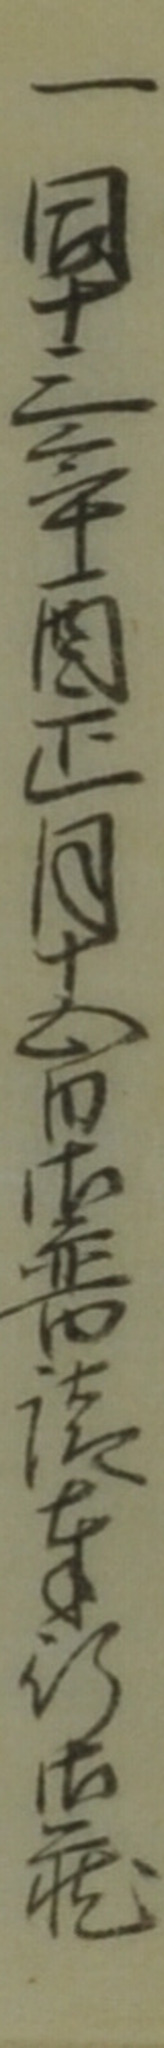一同十三辛酉正月十五日御普請奉行御蔵
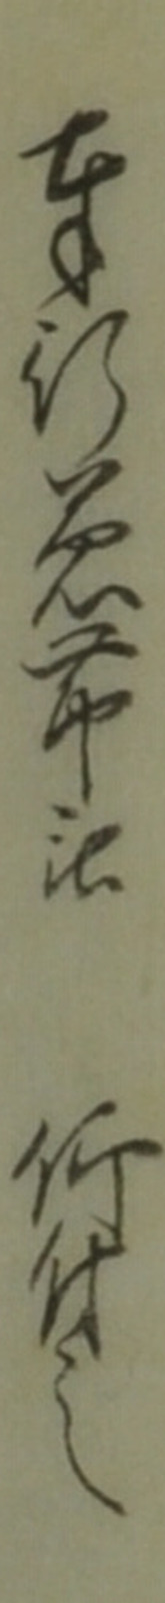奉行兼帯被仰付之
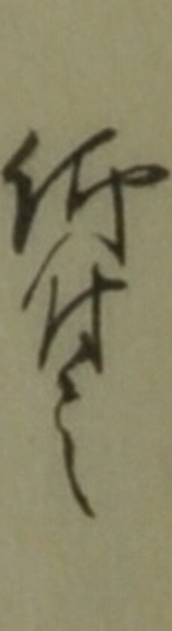仰付之
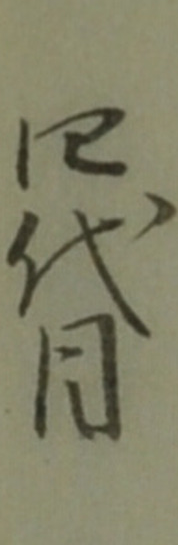四代目
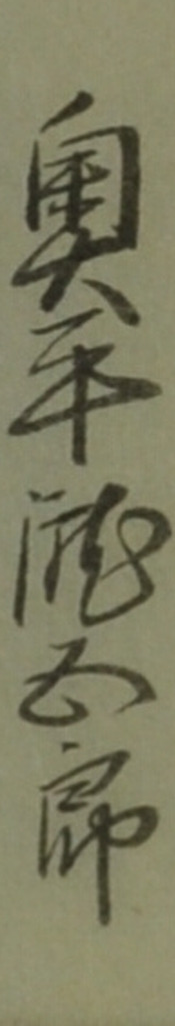奥平瀧五郎
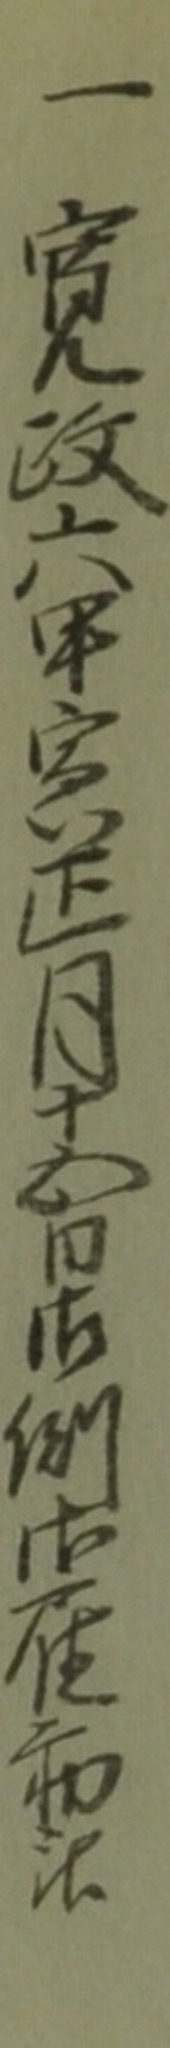一寛政六甲寅正月十五日御側御雇勤被
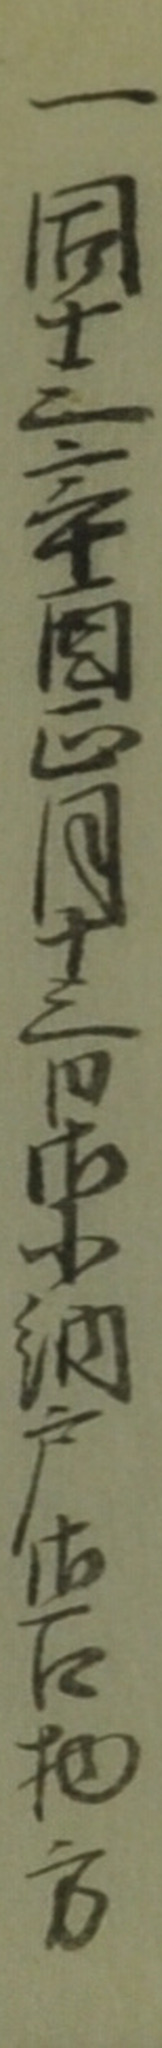一同十三辛酉正月十三日御小納戸御召物方
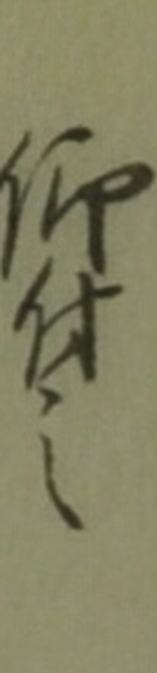仰付之
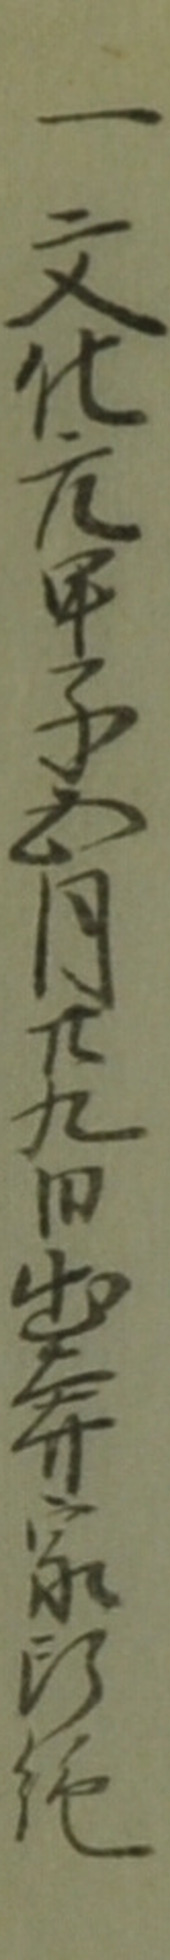一文化元甲子五月廿九日出奔家断絶
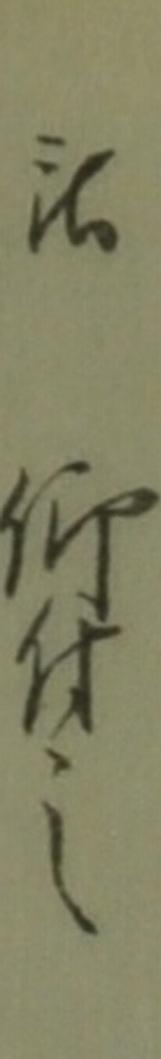被仰付之
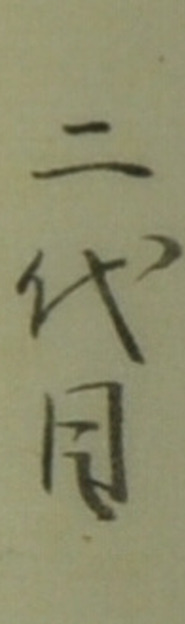二代目

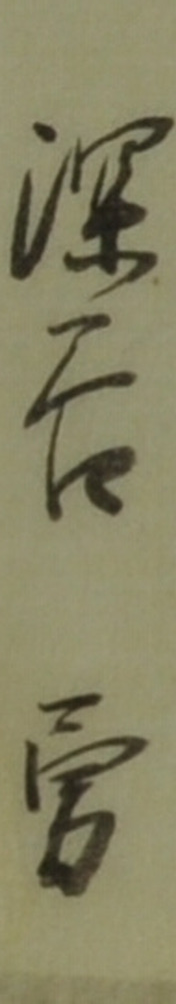深谷勇
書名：諸御役代々録（五）
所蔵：伊那市立高遠町図書館・合同会社AMANE
